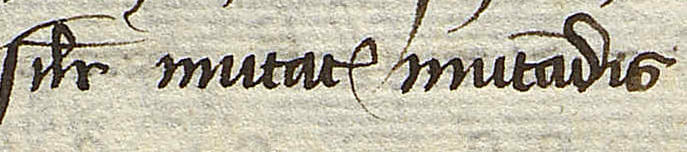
ſilr* mutat* muta*dis
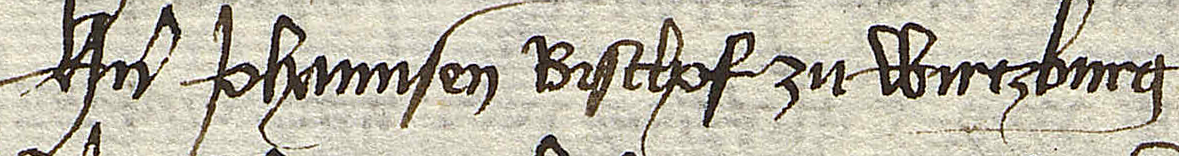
H*n Iohannſen Biſchof ʒu Wircʒburg
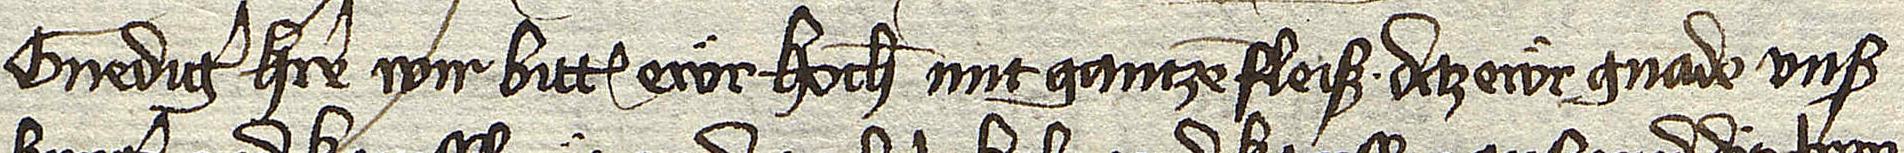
Gnedig* h*re wir bitt* ewr hoch* mit gancʒe* fleiſʒ . daʒ ewr gnade vnſ*
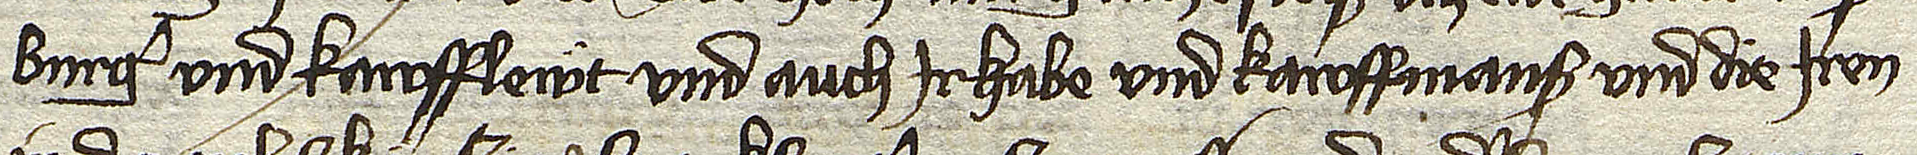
burg* vnd kawfflewt vnd auch Ir habe vnd kawffmanſ* vnd die Iren
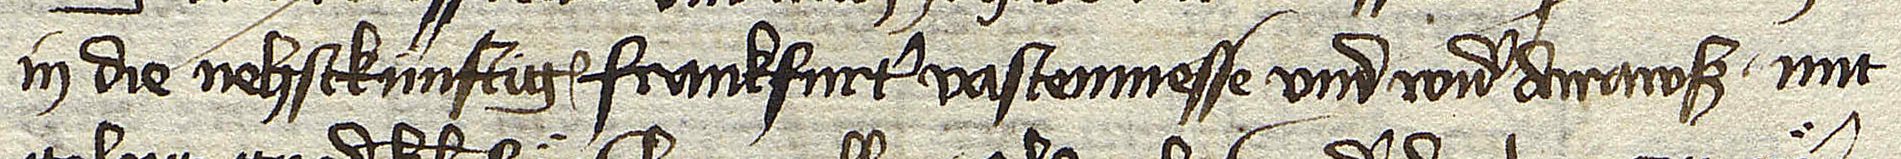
in die nehſtkünftig* frankfurt* vaſtenmeſſe vnd wid* darawſʒ / mit
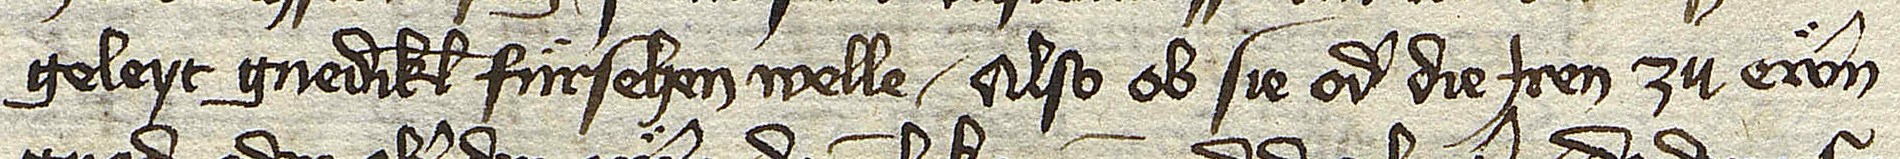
geleyt gnedikl* fürſehen welle / Alſo ob ſie od* die Iren ʒu ew*n
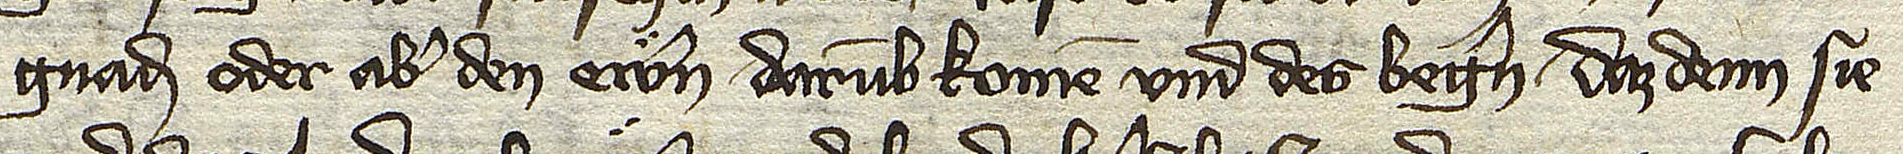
gnad* oder ab* den ew*n / daru*b kome* vnd des beg*n / daʒ denn ſie
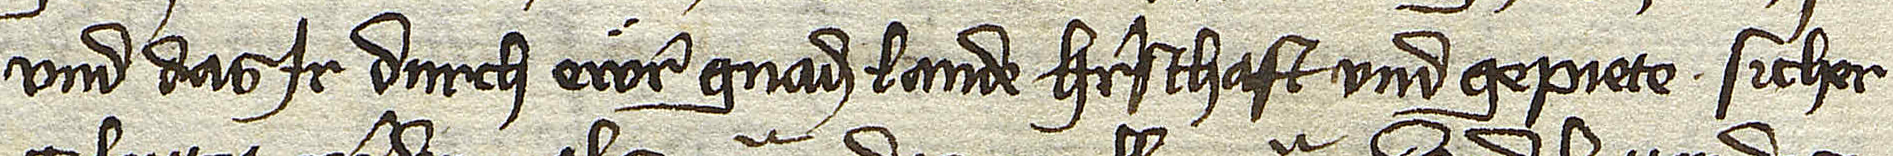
vnd das Ir durch ew*r gnad* lande h*rſchaft vnd gepiete . ſicher
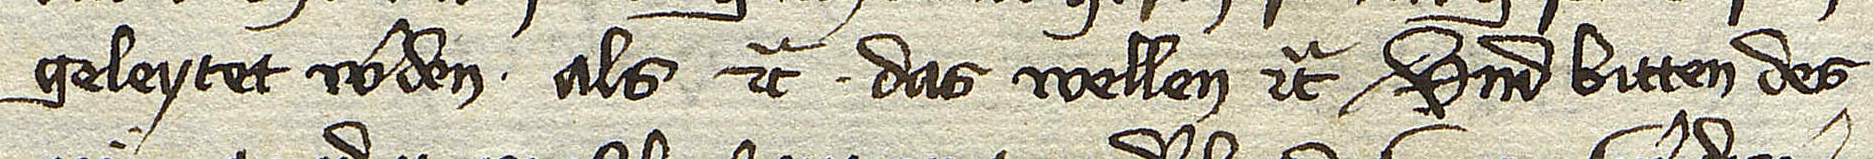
geleytet w*den . als ec* . das wellen ec* / Vnd bitten des
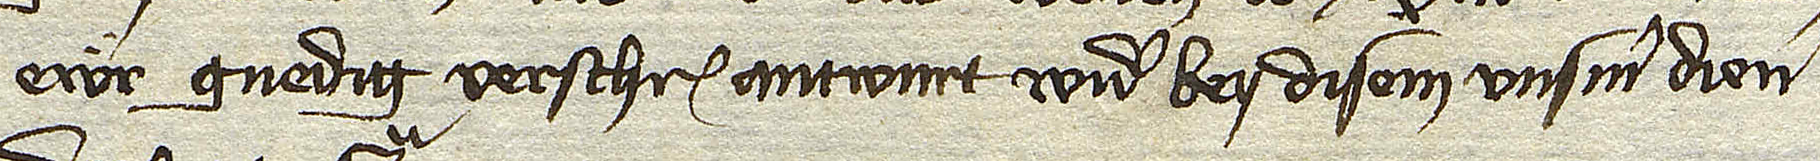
ewr gnedig verſchr* antwurt wid* bey diſem vnſ*m dien*
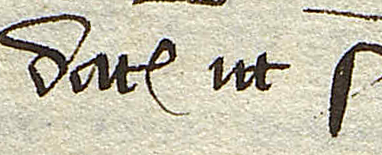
dat* ut ſ*
